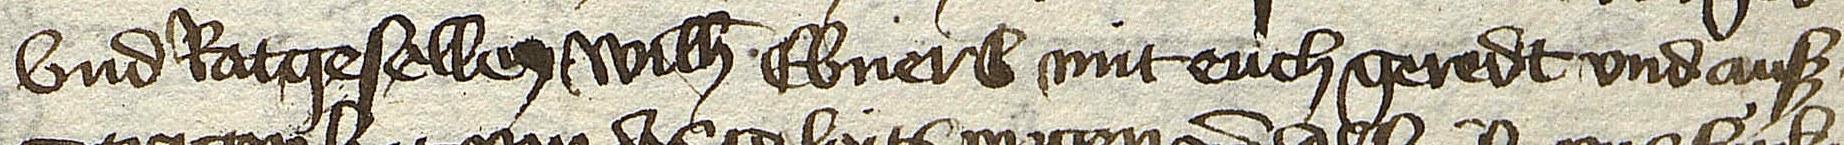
vnd Ratgeſellen wilh* Ebner b mit euch geredt vnd auſʒ -
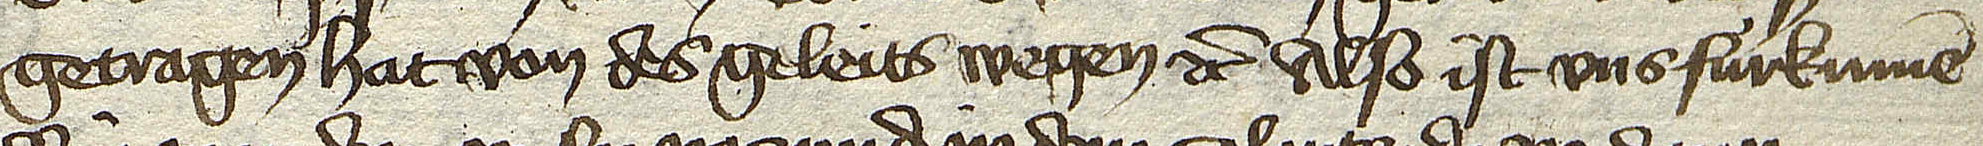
getragen hat von des geleits wegen ec* Alſo iſt vns fürkume*
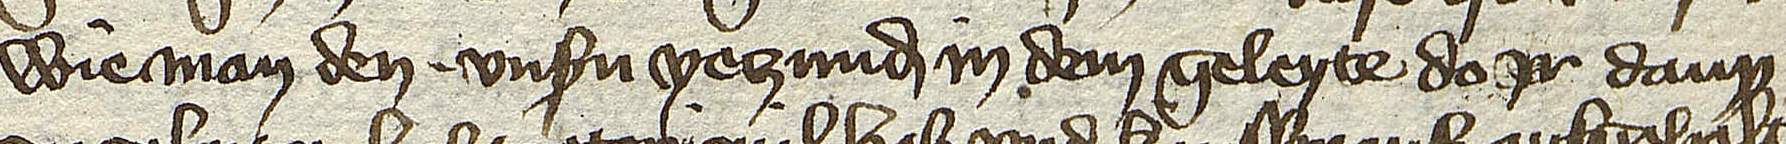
wie man den ~ vnſ*n yecʒund* in dem geleyte do Ir dann
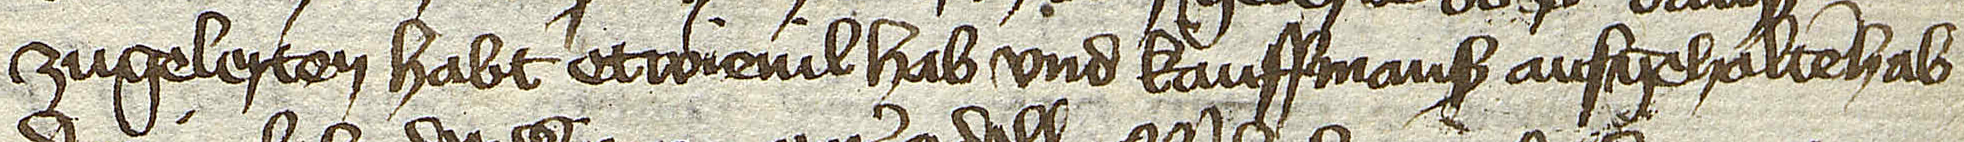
ʒugeleyten habt etwieuil hab vnd kauffmanſ* aufgehalte* hab
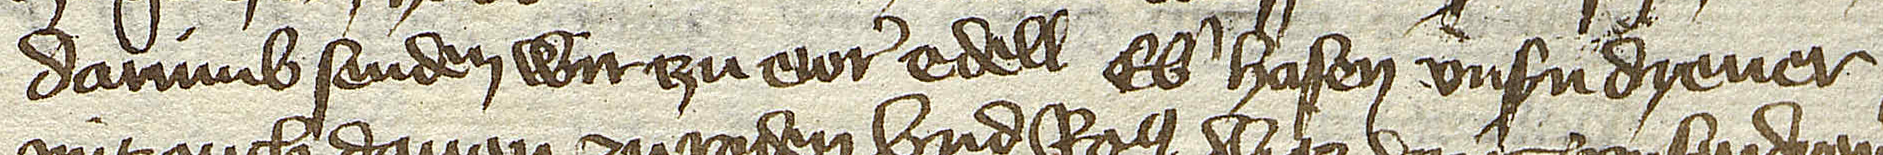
darümb ſenden wir cʒu ew*r edell Eb* haſen vnſ*n dyener
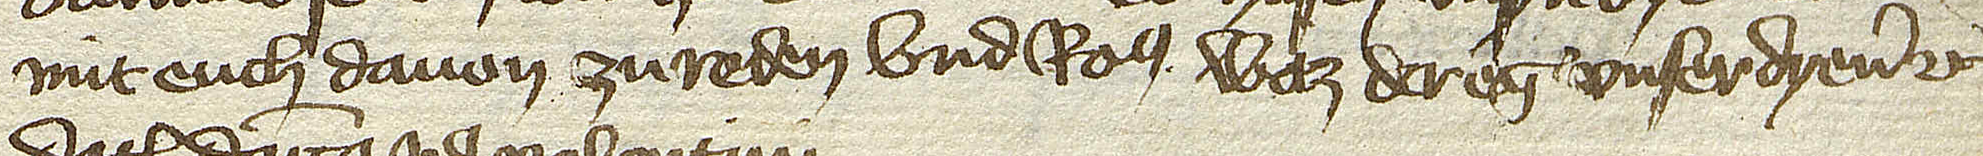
mit euch dauon ʒu reden vnd Ro* . waʒ der eg* vnſer dyen* ec*
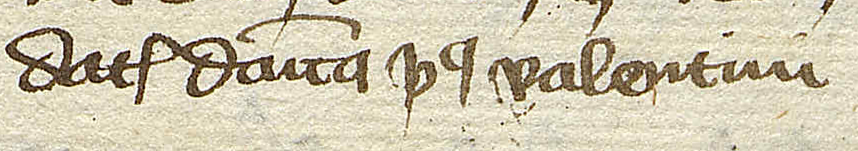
dat* doica* p* valentini
